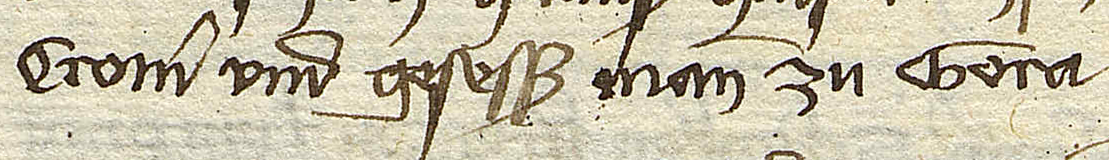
Crom* vnd geſeſſ* man* ʒu Gera
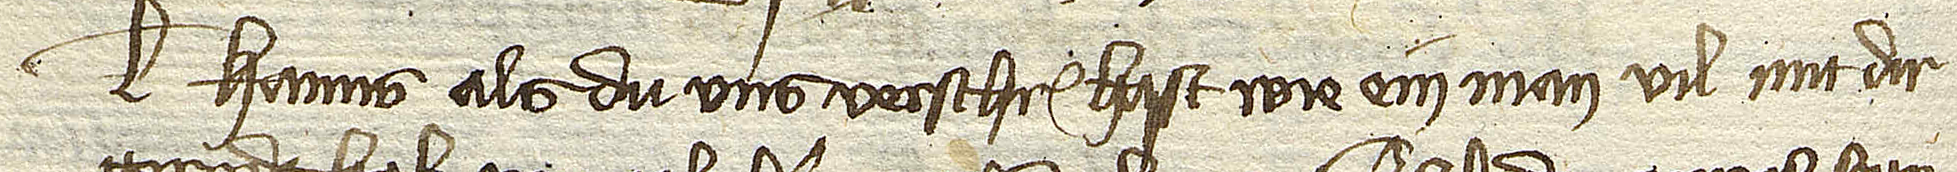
L* hanns als du vns verſchr* haſt wie ein man vil mit dir
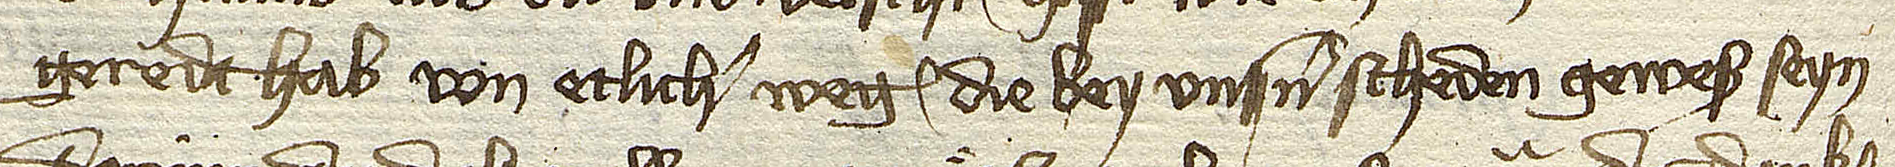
geredt hab von etlich* weg* die bey vnſ*n ſcheden geweſ* ſeyn
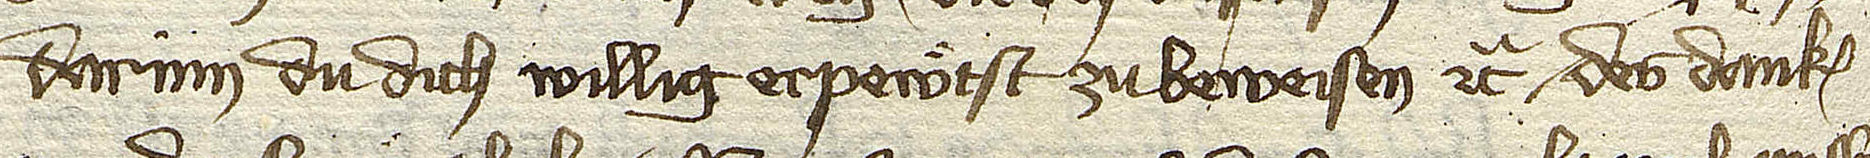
Darinn du dich willig erpewtſt ʒu beweiſen ec* / des dank*
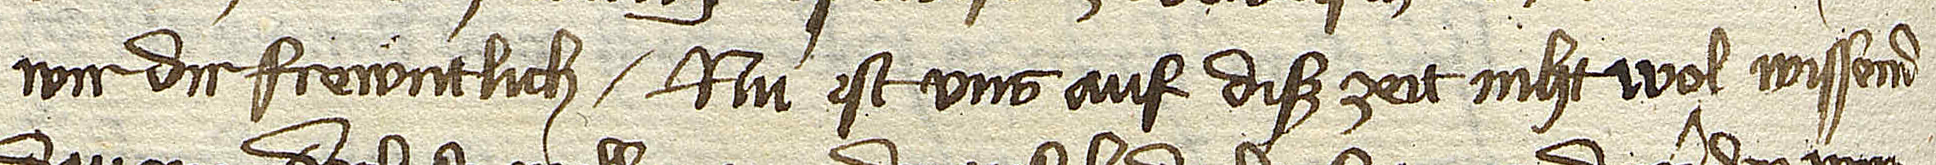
wir dir frewntlich / Nu iſt vns auf diſʒ ʒeit niht wol wiſſend
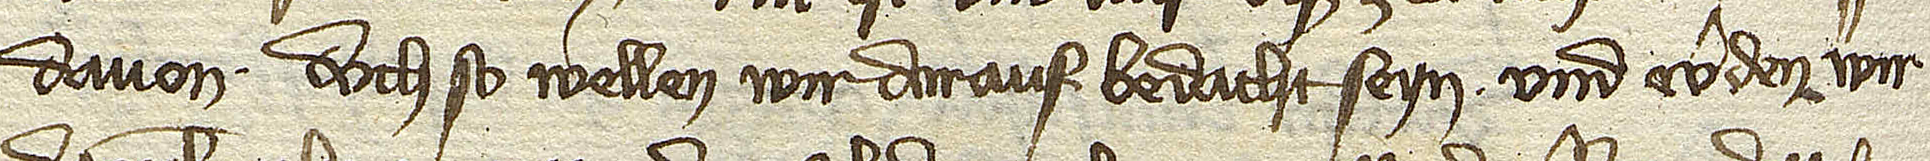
dauon . doch ſo wellen wir darauf bedacht ſeyn . vnd w*den wir
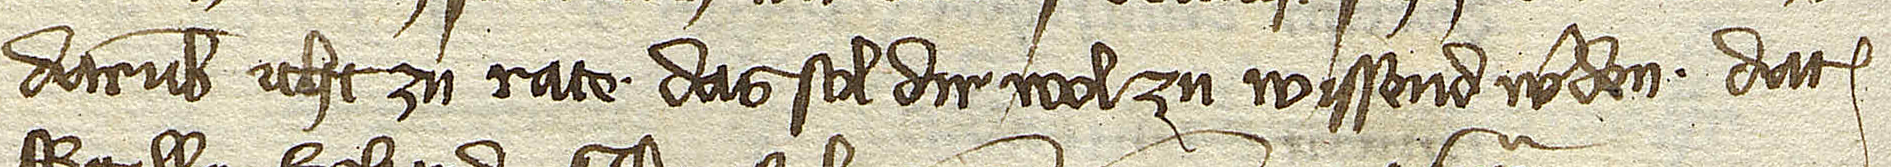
daru*b icht ʒu rate . das ſol dir wol ʒu wiſſend w*den . dat*
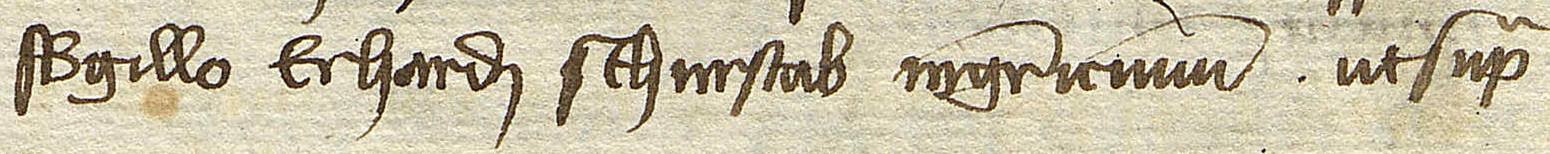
ſ*B gillo Erhardi ſchurſtab m*g*r*iciuiu* . ut ſup*
